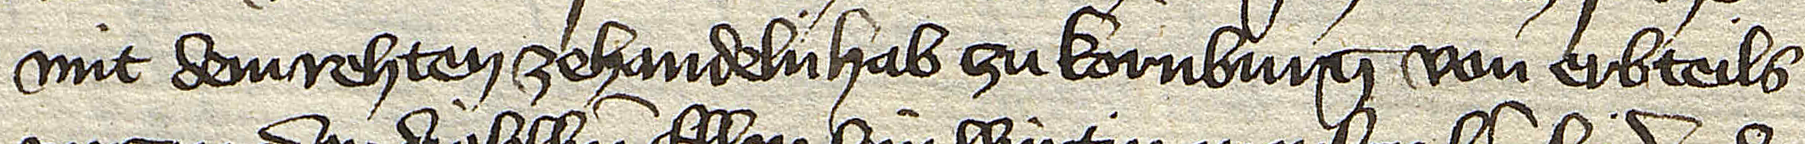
mit dem rehten cʒuhandeln hab cʒu kornburg von erbteils
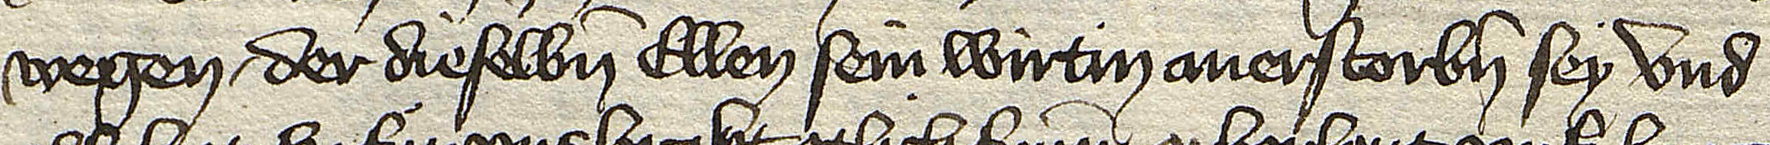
wegen / Der dieſelbn* Ellen ſein wirtin anerſtorbn* ſey vnd
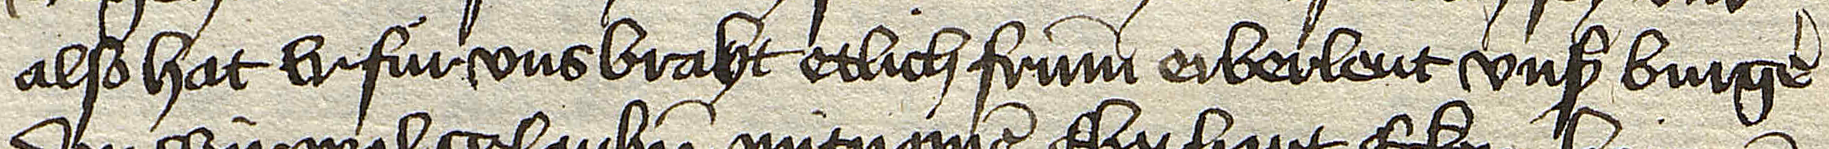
alſo hat Er für vns braht etlich frum* erberleut vnſ* burge*
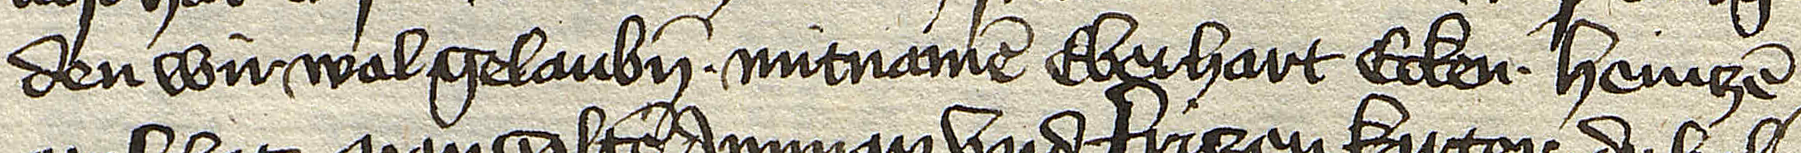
den wir wol gelaubn* . mitname* Eberhart Ecken . heincʒe*
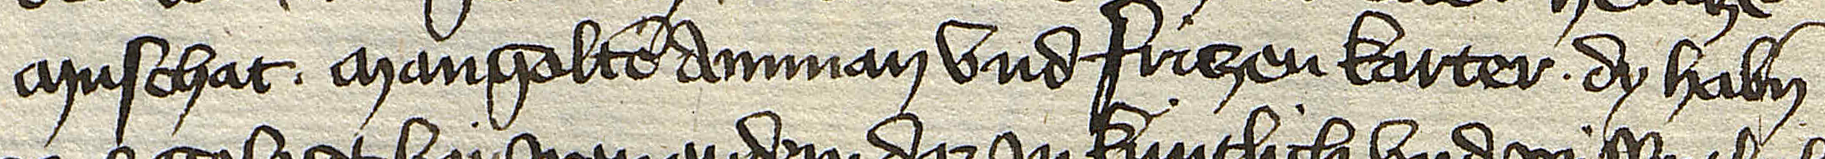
Muſchat . Mangolte* Amman Vnd Fricʒen karter . dy habn*
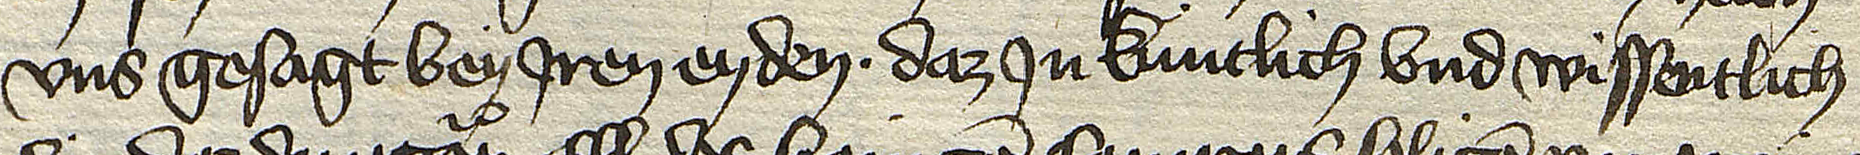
vns geſagt bey Iren eyden . daʒ In küntlich vnd wiſſentlich
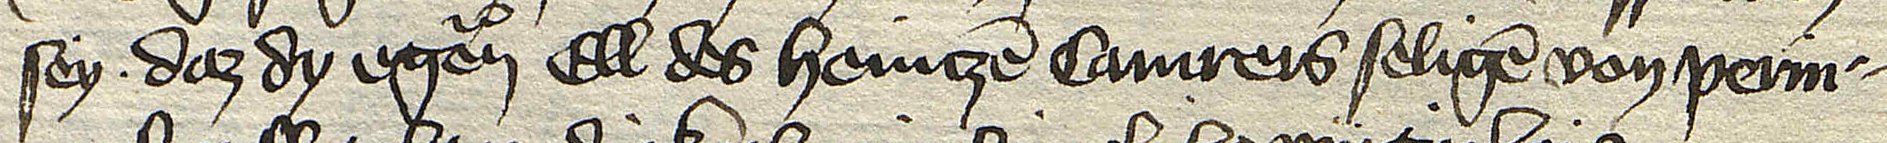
ſey . daʒ dy egen* Ell des heincʒe* Camrers ſelige* von perin =
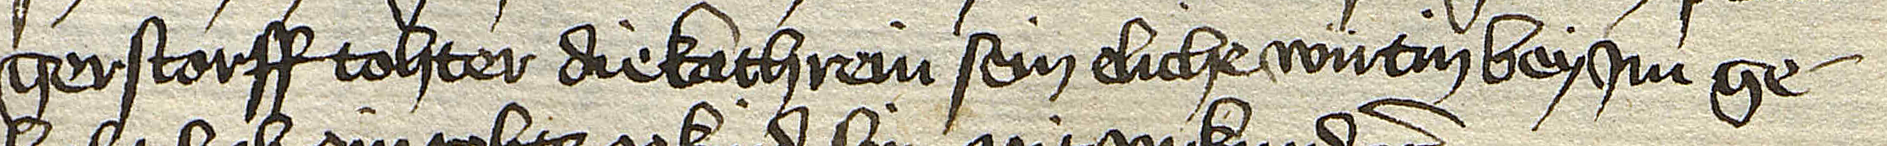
gerſtoff tohter die kathrein ſein eliche würtin bey Im ge -
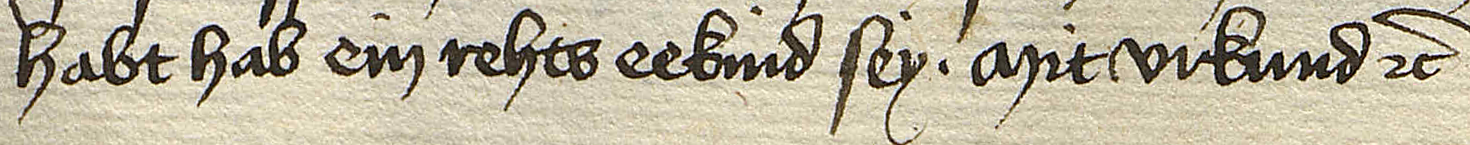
habt hab ein rehts eekind ſey . Mit vrkund ec*
